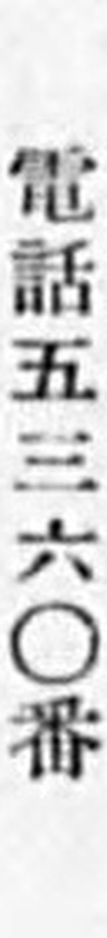電話五三六〇番
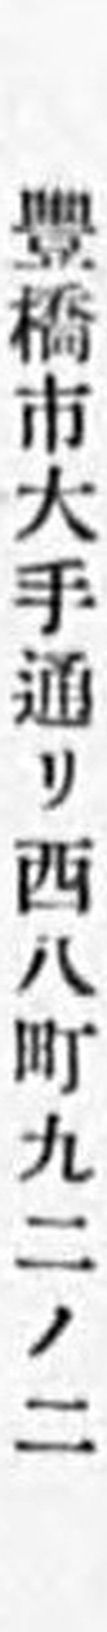豊橋市大手通リ西八町九二ノ二
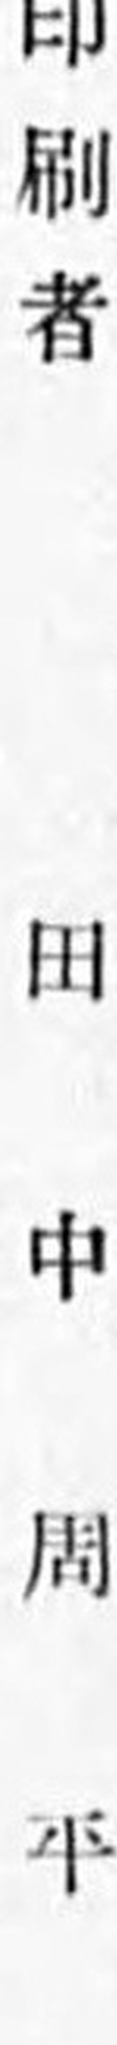印刷者田中周平
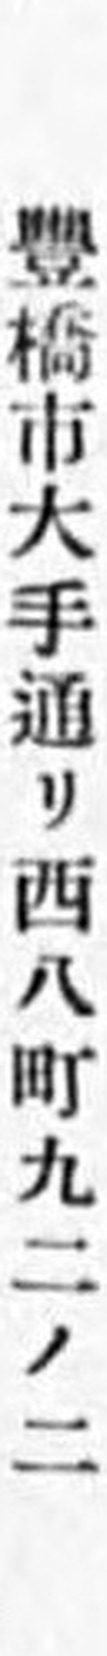豊橋市大手通リ西八町九二ノ二
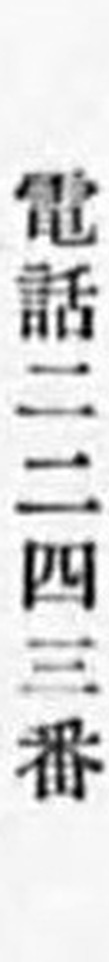電話二二四三番
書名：豊橋市立高山病院年報. 昭和12年度
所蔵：国立国会図書館 National Diet Library, JAPAN
